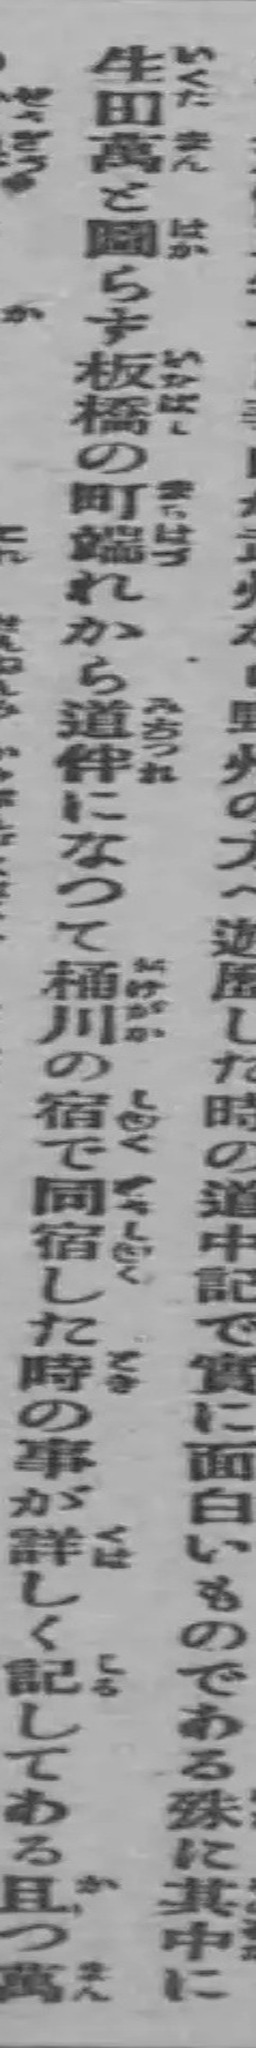生田萬と図らず板橋の町端れから道伴になつて桶川の宿で同宿した時の事が詳しく記してある且つ萬
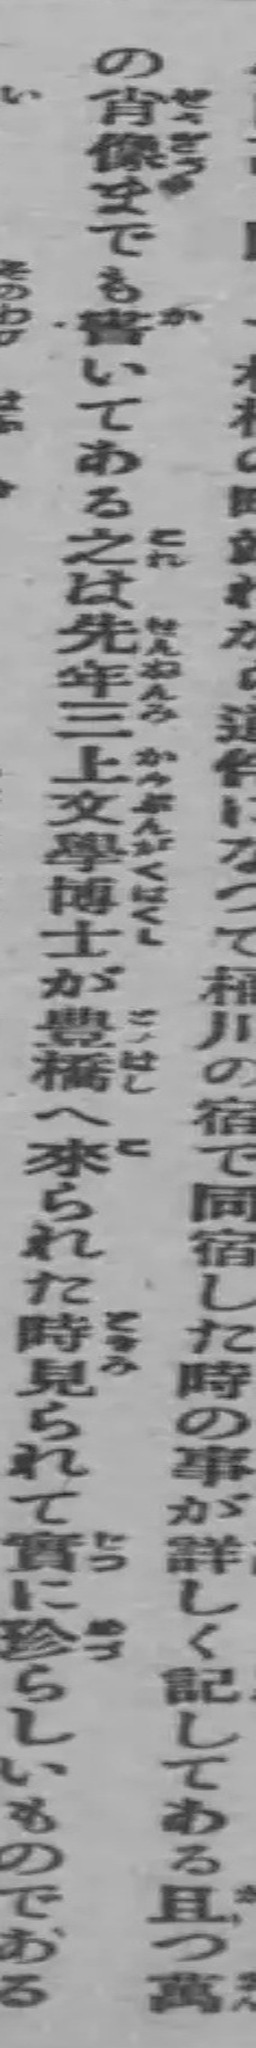の肖像までも書いてある之は先年三上文学博士が豊橋へ来られた時見られて実に珍らしいものである
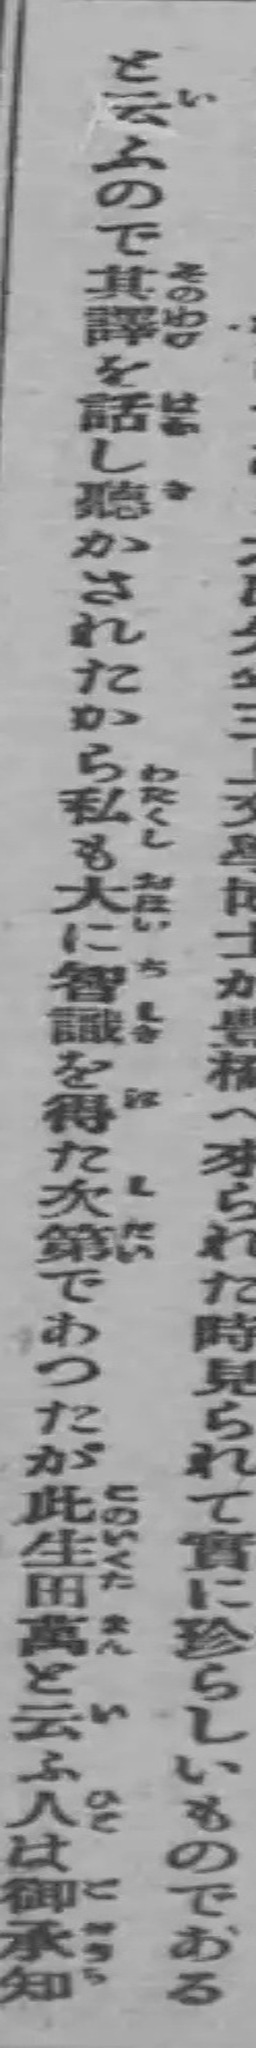と云ふので其訳を話し聴かされたから私も大に知識を得た次第であつたが此生田萬と云ふ人は御承知
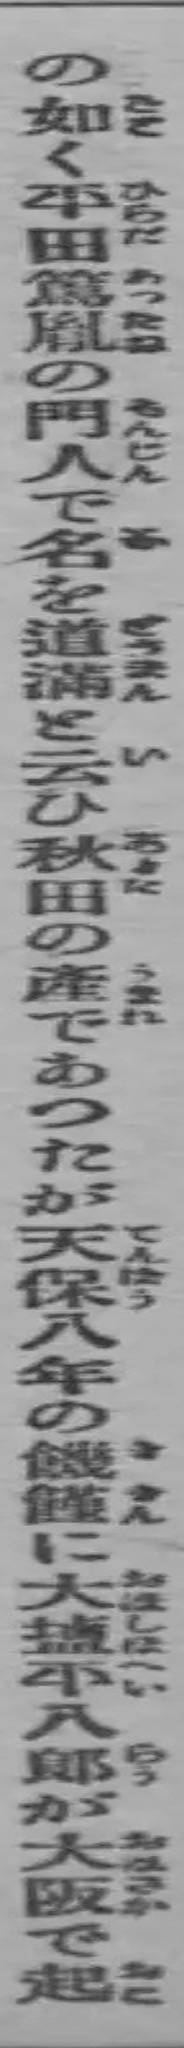の如く平田篤胤の門人で名を道満と云ひ秋田の産であつたが天保八年の飢饉に大塩平八郎が大阪で起
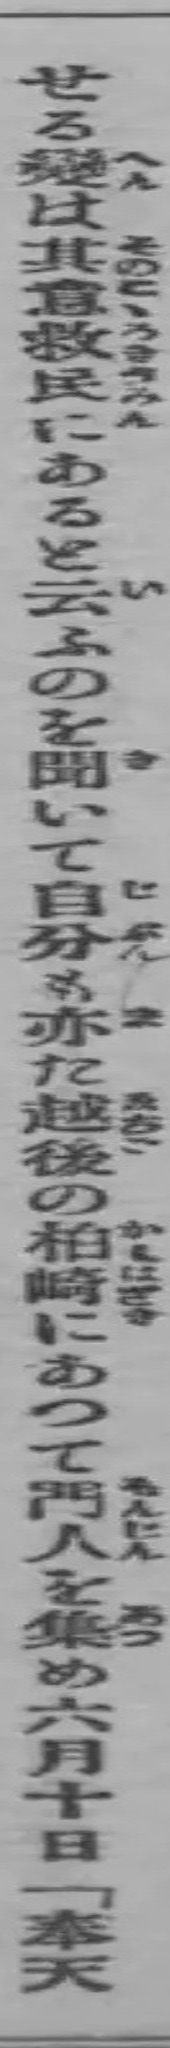せる変は其意救民にあると云ふのを聞いて自分も亦た越後の柏崎にあつて門人を集め六月十日「奉天
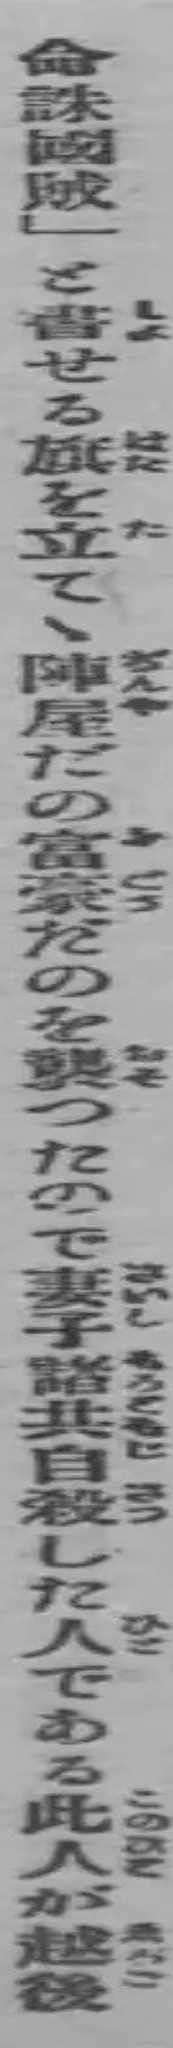命誅国賊」と書せる旗を立てゝ陣屋だの富豪だのを襲つたので妻子諸共自殺した人である此人が越後
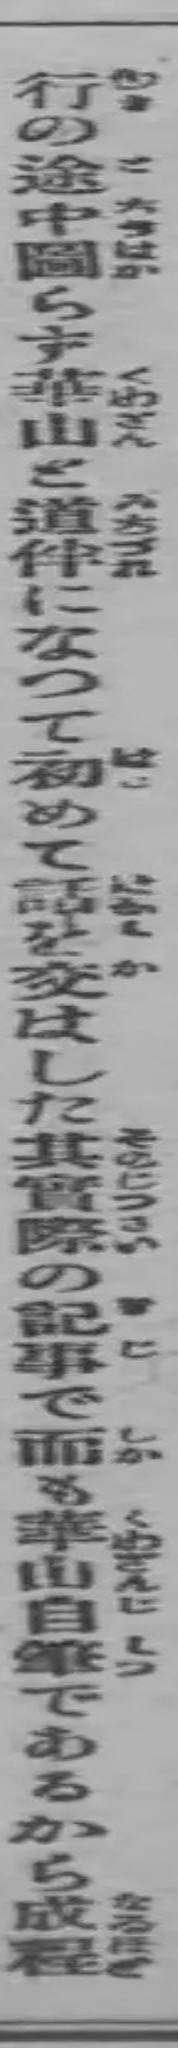行の途中図らず崋山と道伴になつて初めて話を交はした其実際の記事で而も崋山自筆であるから成程
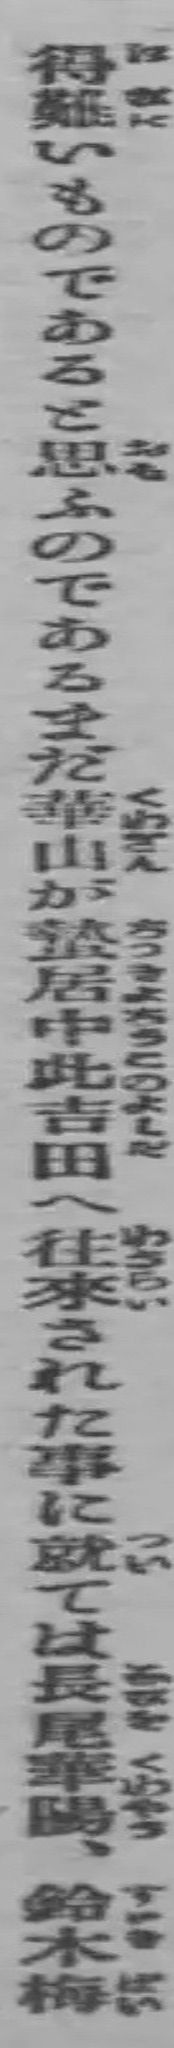得難いものであると思ふのであるまだ崋山が蟄居中此吉田へ往来された事に就ては長尾華陽、鈴木梅
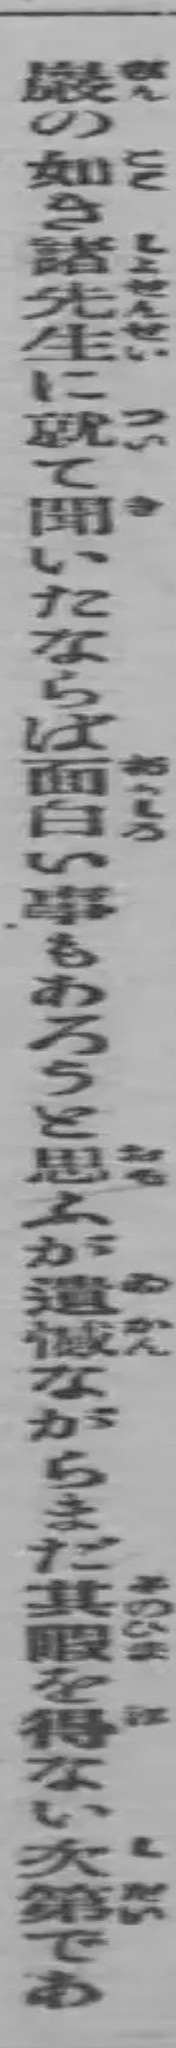厳の如き諸先生に就て聞いたならば面白い事もあろうと思ふが遺憾ながらまだ其暇を得ない次第であ
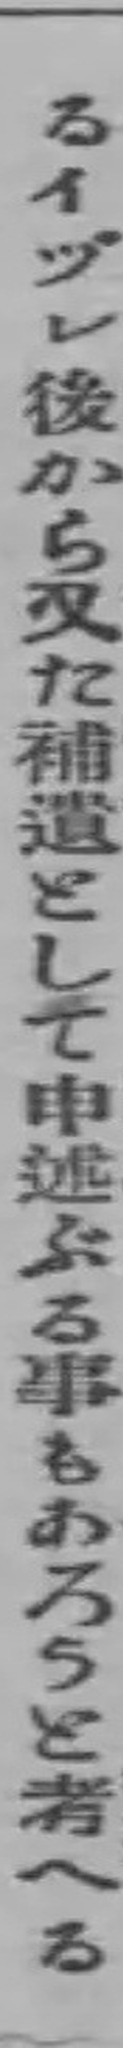るイヅレ後から又た補遺として申述ぶる事もあろうと考へる
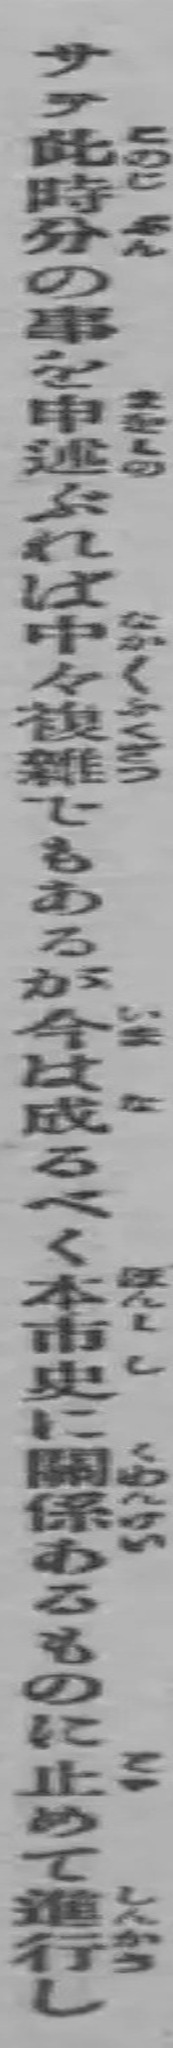サテ此時分の事を申述ぶれば中々複雑でもある今は成るべく本市史に関係あるものに止めて進行し
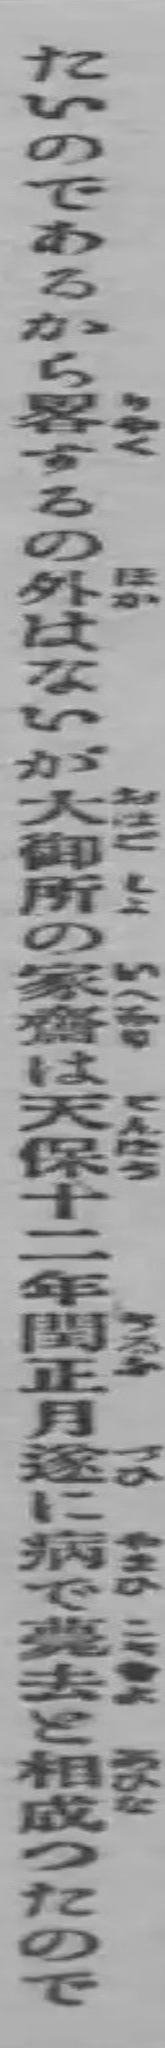家斉の薨去たいのであるから略するの外はないが大御所の家斉は天保十二年閏正月遂に薨去と相成つたので
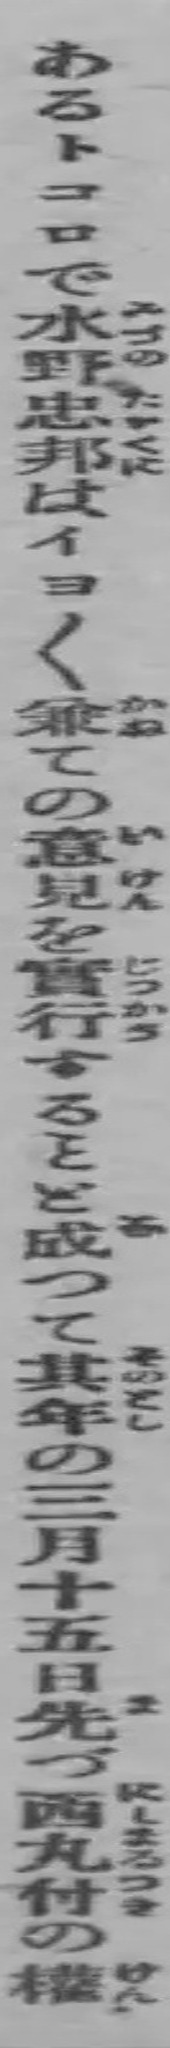あるトコロで水野忠邦はイヨ〳〵兼ての意見を実行することと成つて其年の三月十五日先づ西丸付の権
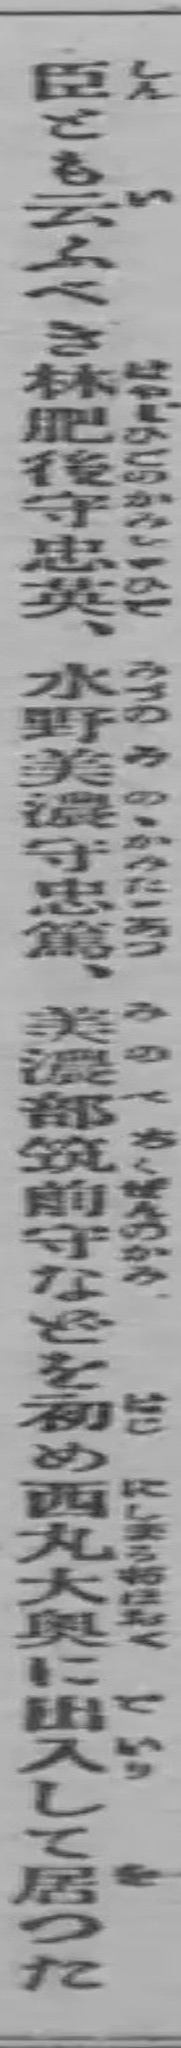臣とも云ふべき林肥後守忠英、水野美濃守忠篤、美濃部筑前守などを初め西丸大奥に出入して居つた
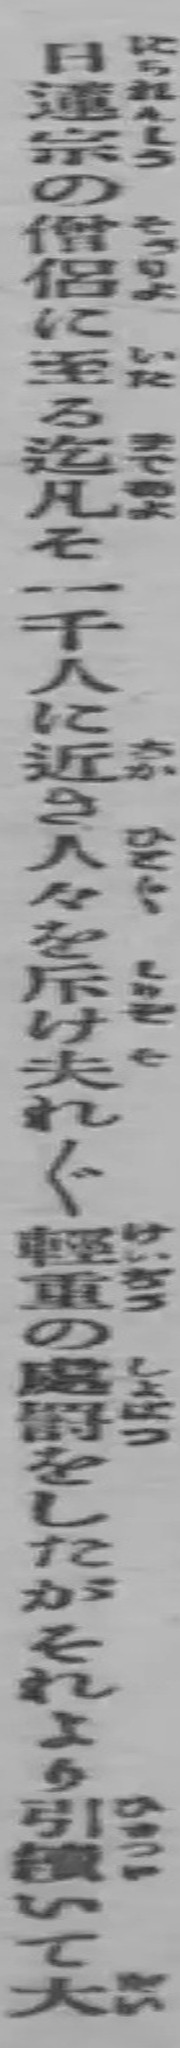日蓮宗の僧侶に至る迄凡そ一千人に近き人々を斥け夫れ〴〵軽重の処罰をしたがそれより引続いて大
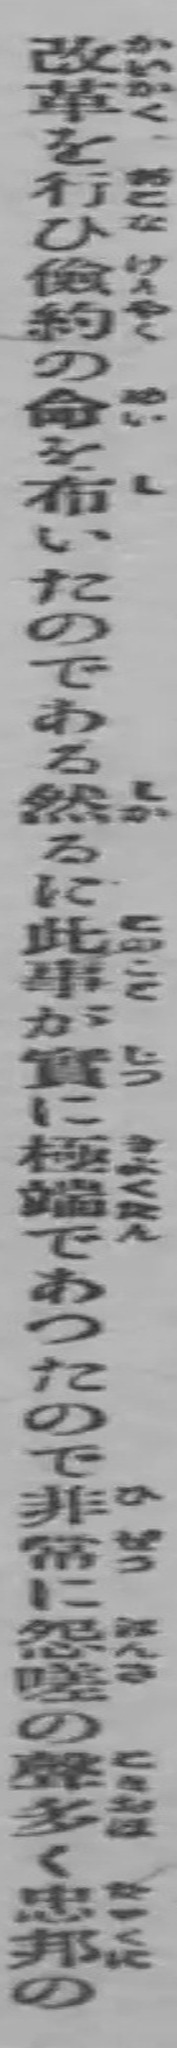改革を行ひ倹約の命を布いたのである然るに此事が実に極端であつたので非常に怨嗟の声多く忠邦の
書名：豊橋市史談
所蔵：国立国会図書館 National Diet Library, JAPAN
